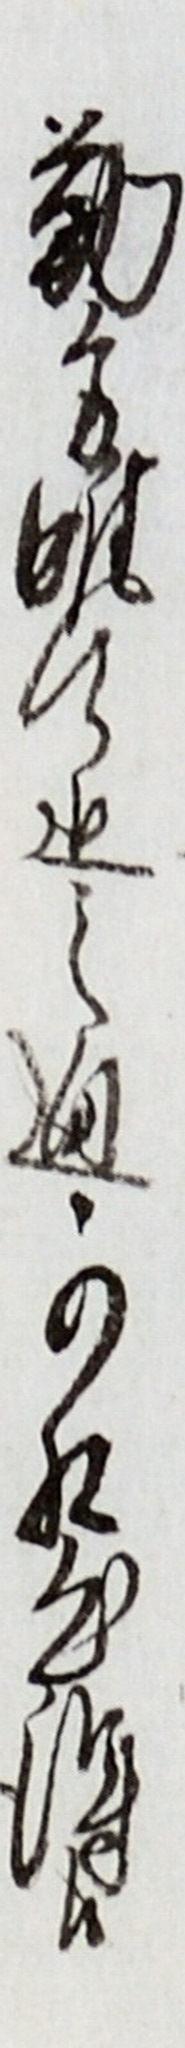勤方唯今迄之通可相心得候
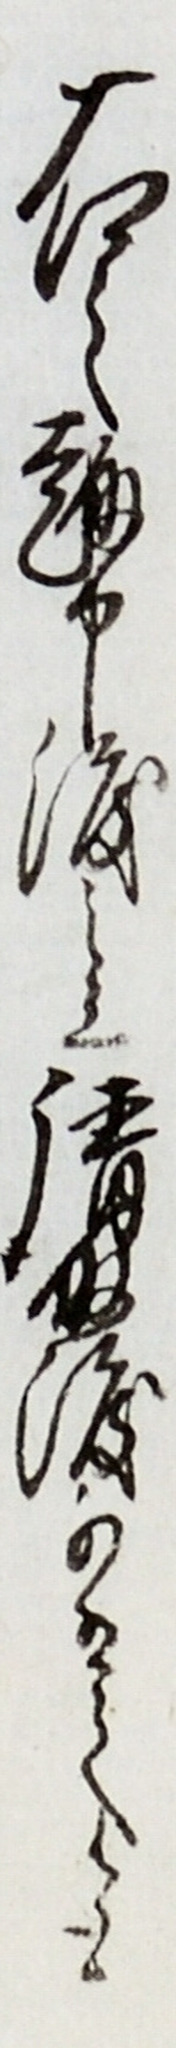右之趣申渡候上請取渡可有之候以上
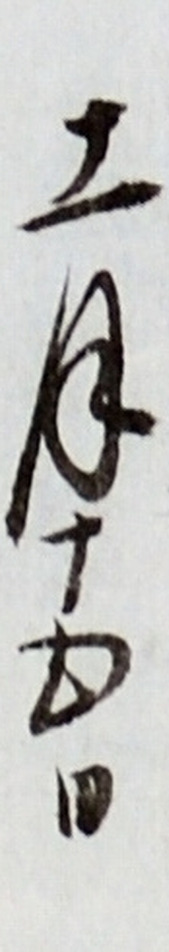十一月十五日
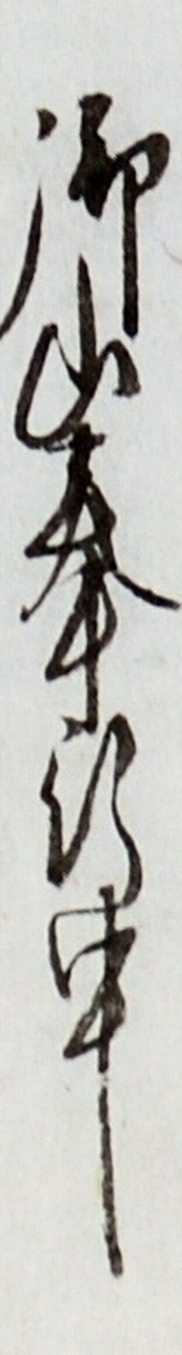御山奉行中
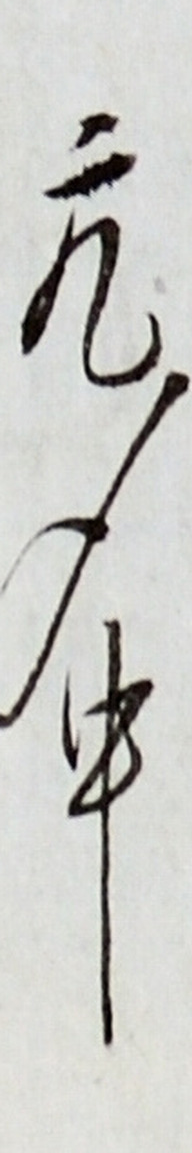元〆中
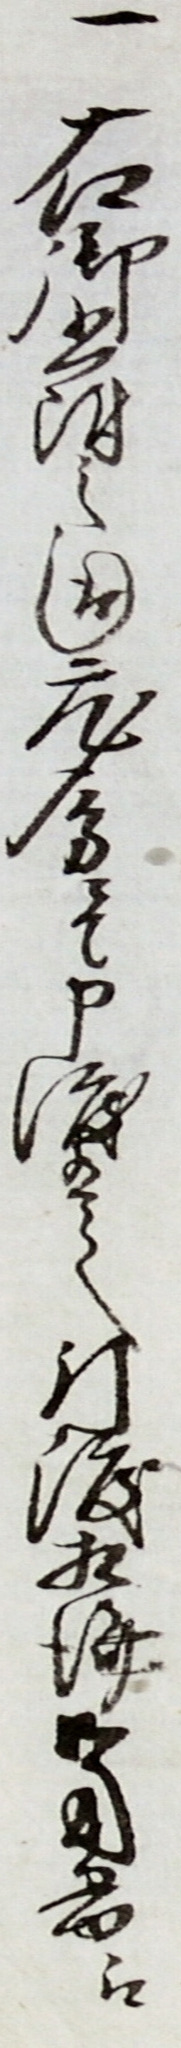一右御書附之趣元〆方ニて申渡有之候引渡相済御用番江
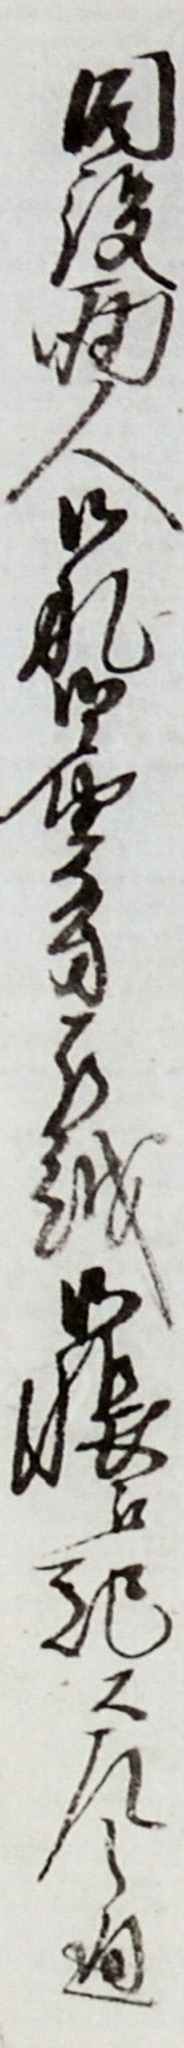同役当人御札御届罷越御帳江記ス左之通
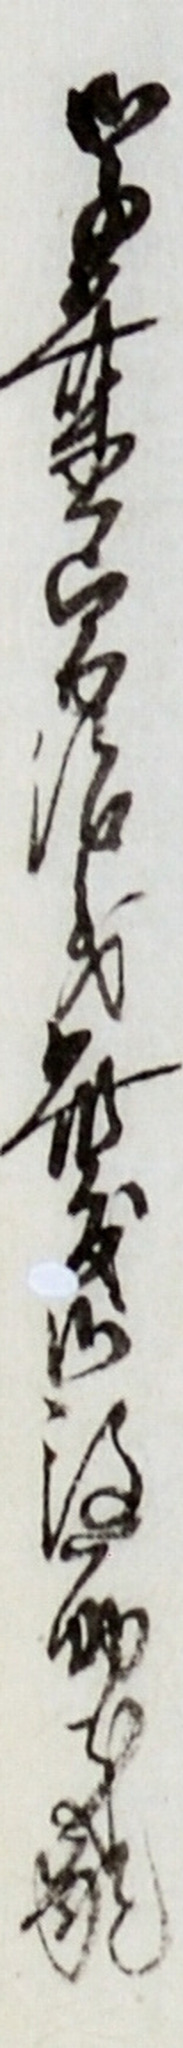御子柴勇治義此度御役筋支配

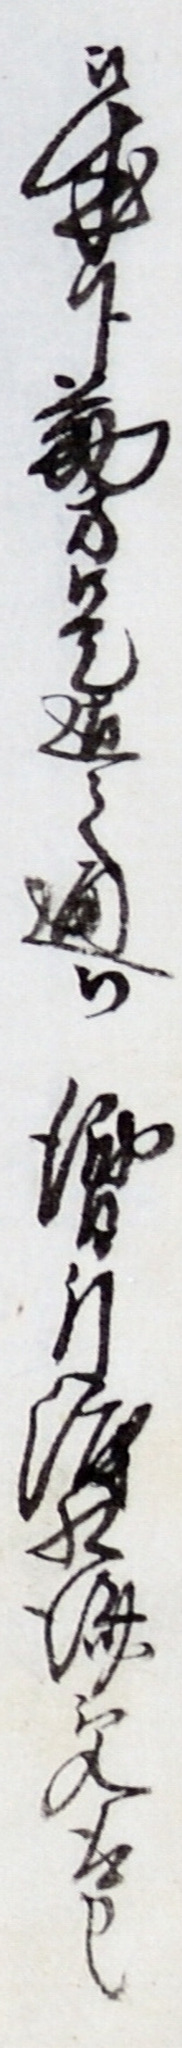被成下勤方是迄之通被仰付引渡相済受取申候
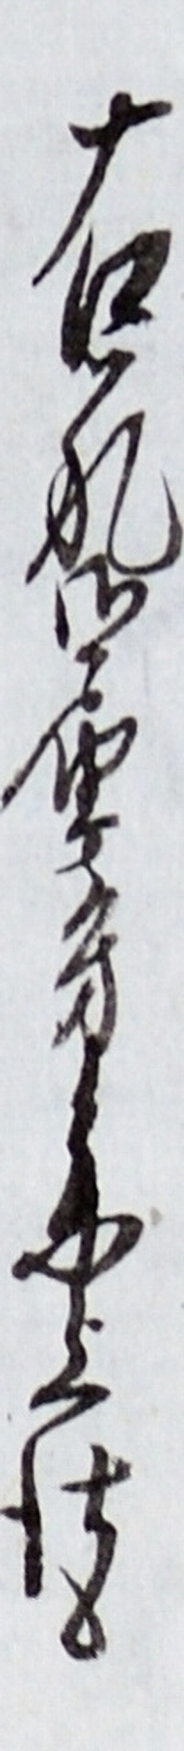右御礼御届方参上仕候
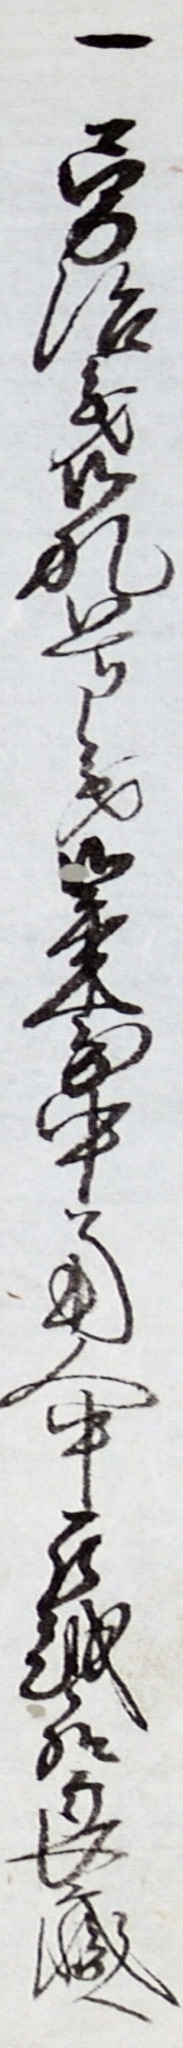一勇治義御札廻り之義御意義中用人中罷越候様良蔵へ
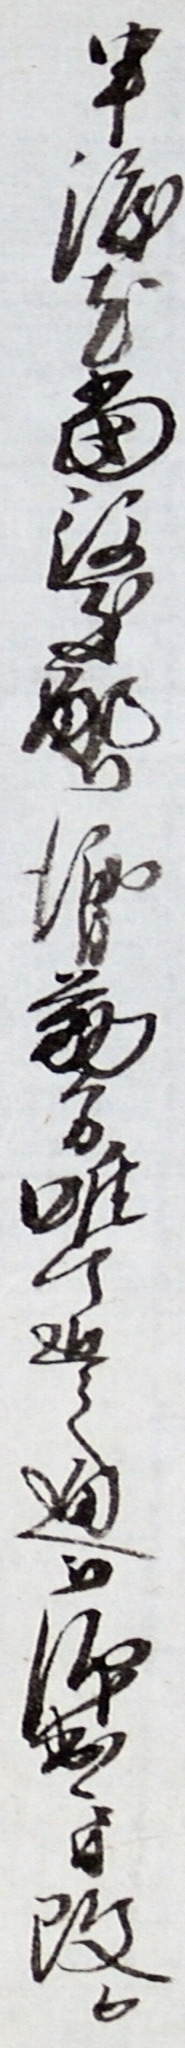申渡尤当役支配候勤方唯一追々通被仰出候ニ付改而
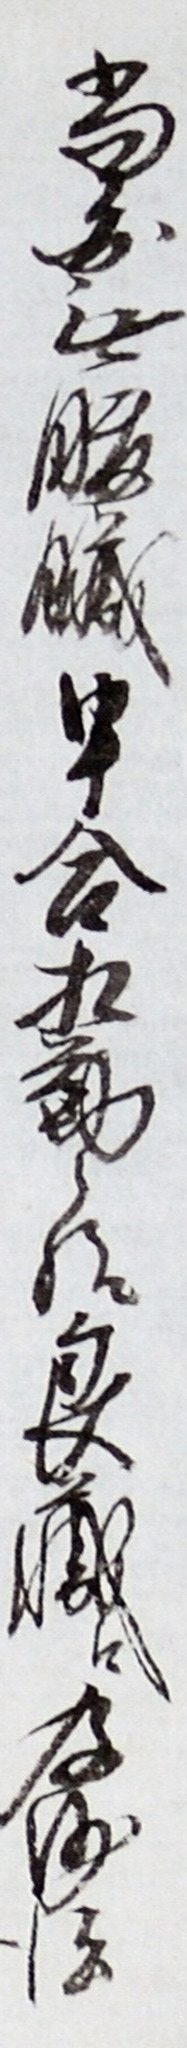尚亦無服職申合相勤候様良蔵江及沙汰
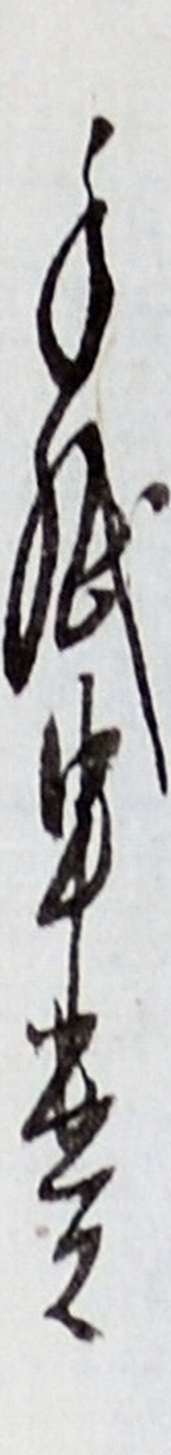手紙申遣ス
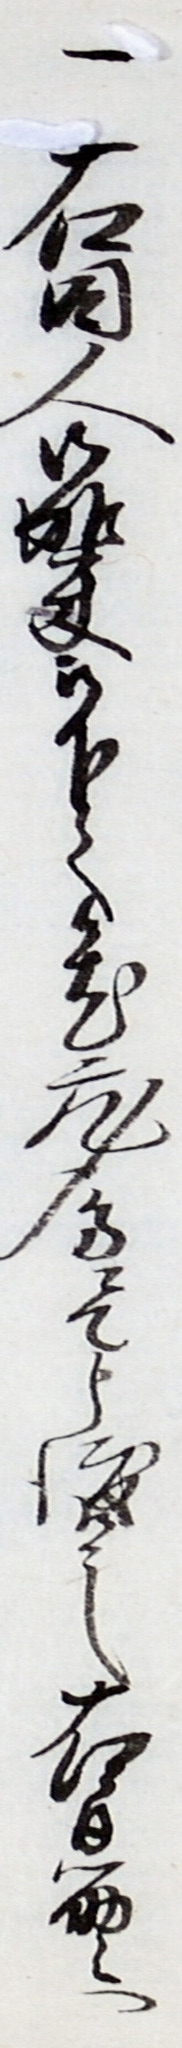一右同人御家来被下之候尤元〆方ニて申渡之右日筋ニ
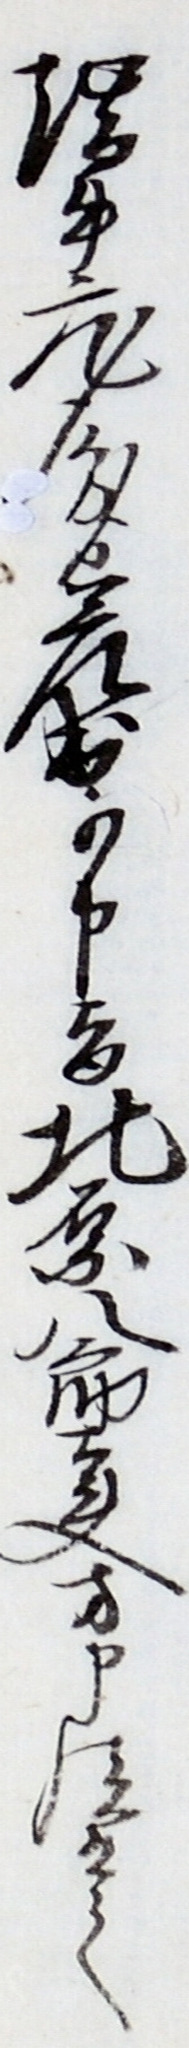端元〆方迄差出可申旨北原八郎太夫方申談有之
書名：御山奉行御用控
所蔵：伊那市立高遠町図書館・合同会社AMANE
